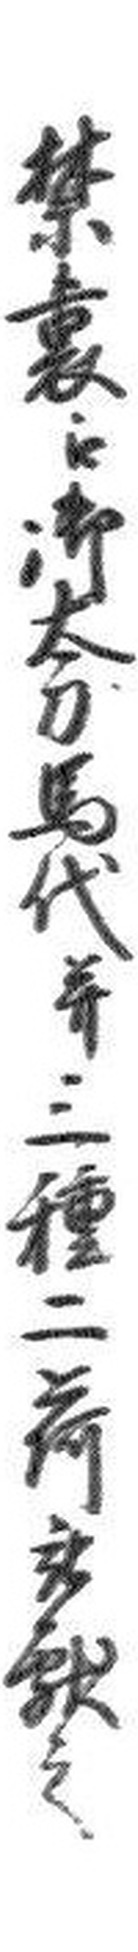禁裏江御太刀馬代并三種二荷被献之
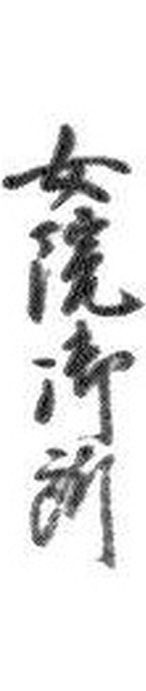女院御所
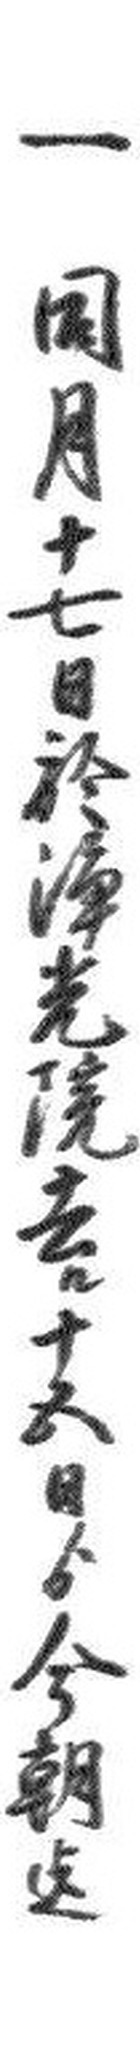一同月十七日於浄光院去ル十五日ゟ今朝迄
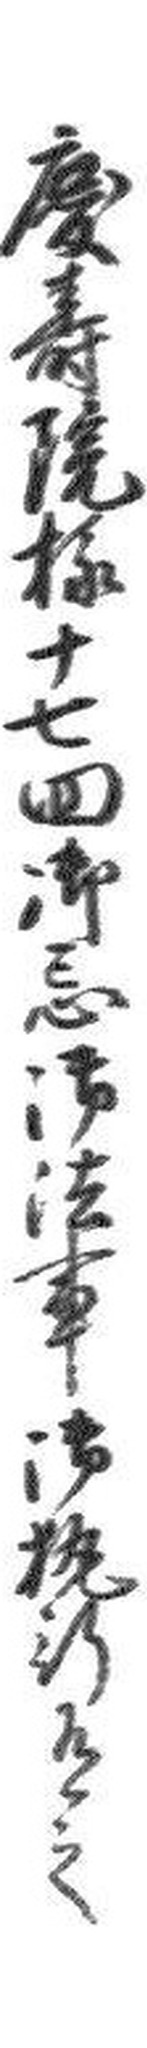慶寿院様十七回御忌御法事御執行有之
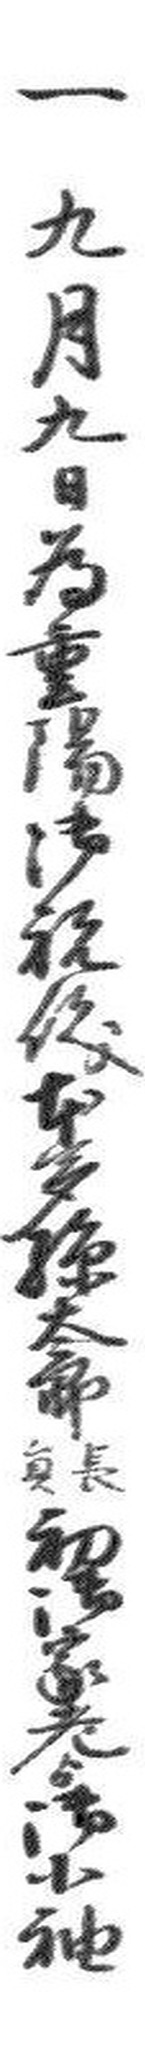一九月九日為重陽御祝儀本多孫太郎長員初御家老ゟ御小袖

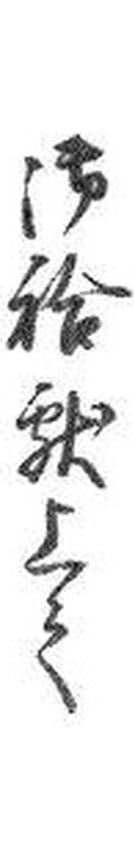御袷献上之
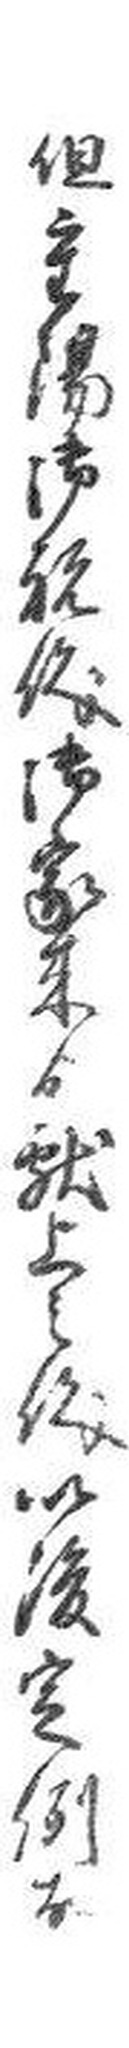但重陽御祝儀御家来ゟ献上之儀以後定例故
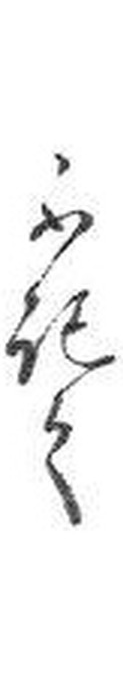不記之
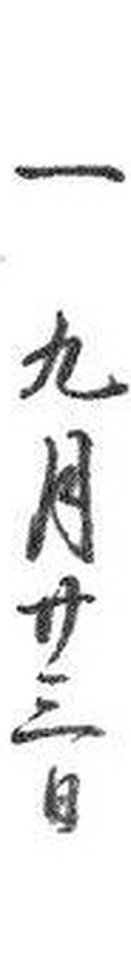一九月廿三日
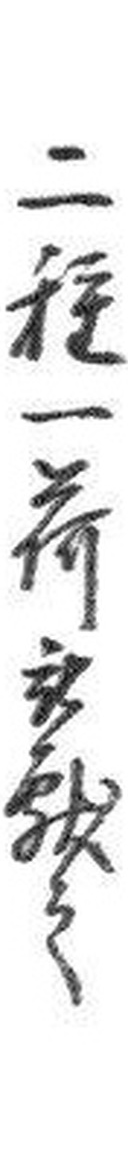二種一荷被献之
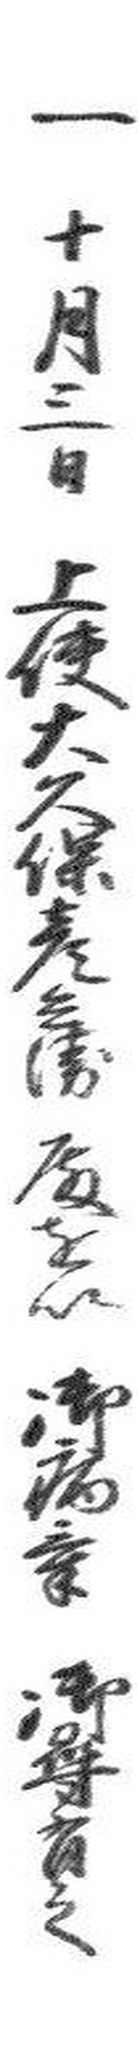一十月三日上使大久保彦兵衛殿を以御病気御尋有之
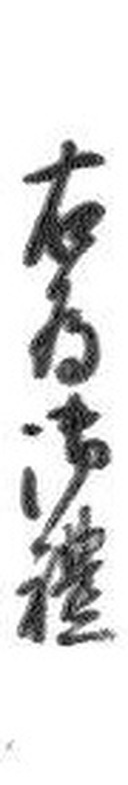右為御礼
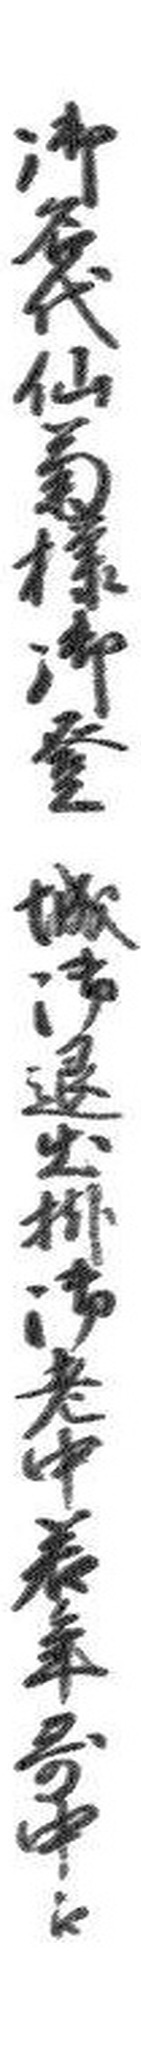御名代仙菊様御登城御退出掛御老中若年寄中江
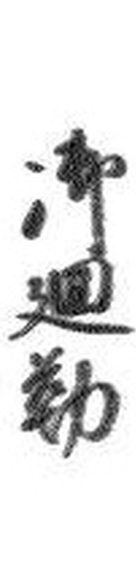御回勤
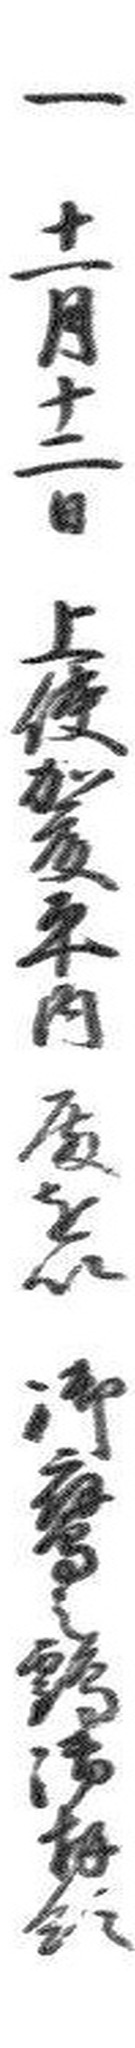一十一月十二日上使加藤平内殿を以御鷹之鶴御拝領
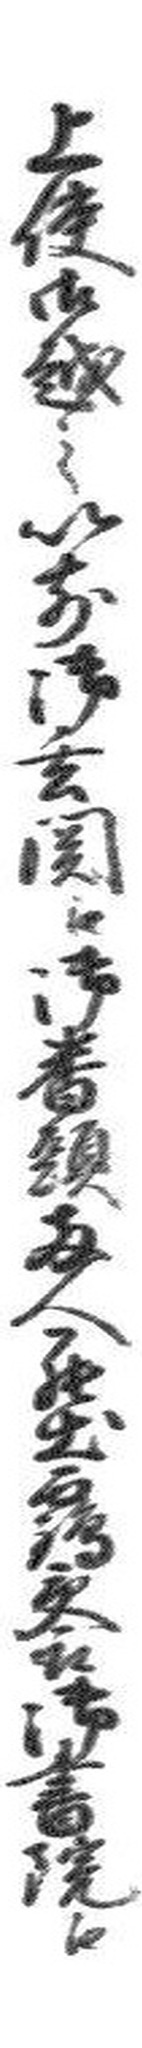上使御越之以前御玄関江御番頭両人罷出鶴受取御書院江
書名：家譜 十一 昌親公 従延宝二年到延宝四年八月
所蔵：福井県文書館 Fukui Prefectural Archives
